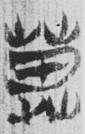莫
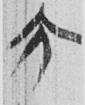大
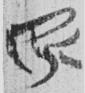𡚦（焉）
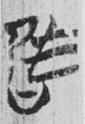唯（雖）
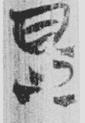○（得）
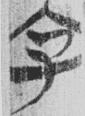○（免）
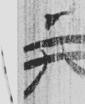而
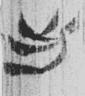出
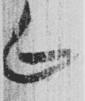㠯（以）
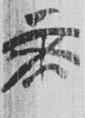不
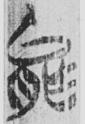能
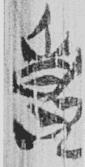事
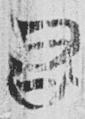君
